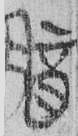𨟻（將）
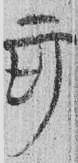可（何）
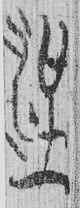浧（盈）
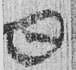日
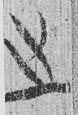之
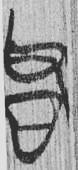○（始）
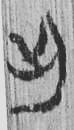出
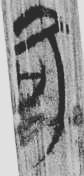可（何）
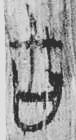古（故）
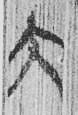大
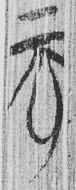而
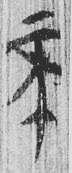不
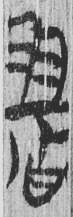○（炎）
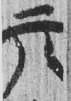亓（其）
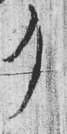人
